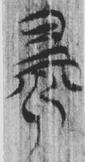耑（端）
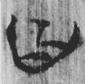曰
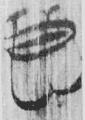母
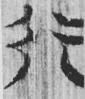行
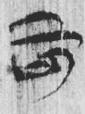可
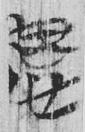悔
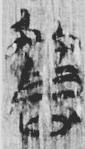○（席）
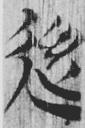後
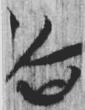左
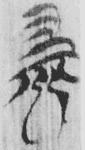耑（端）
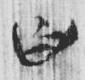曰
